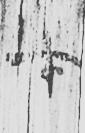七十
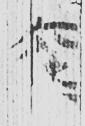六十=
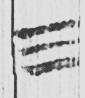三
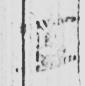五
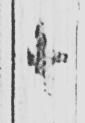十
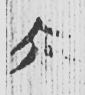六
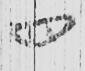四
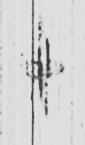十
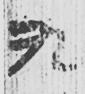九
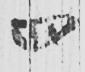四
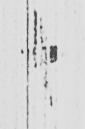十
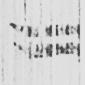二
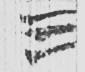三
